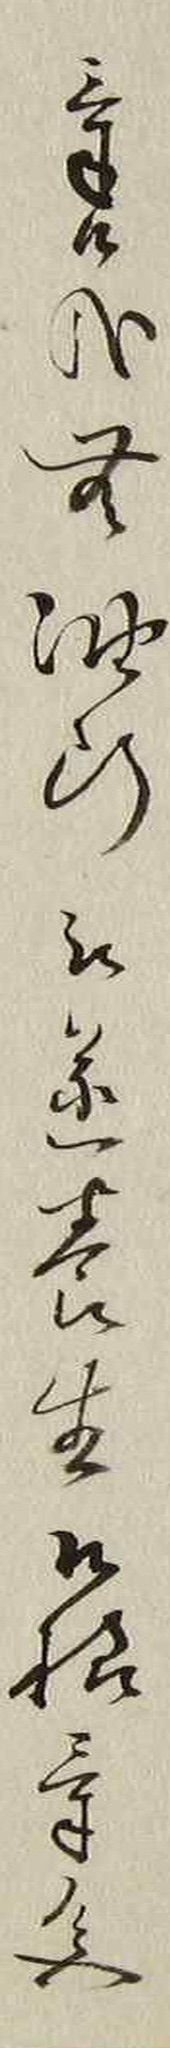気候哉無由断被遂養生様気色
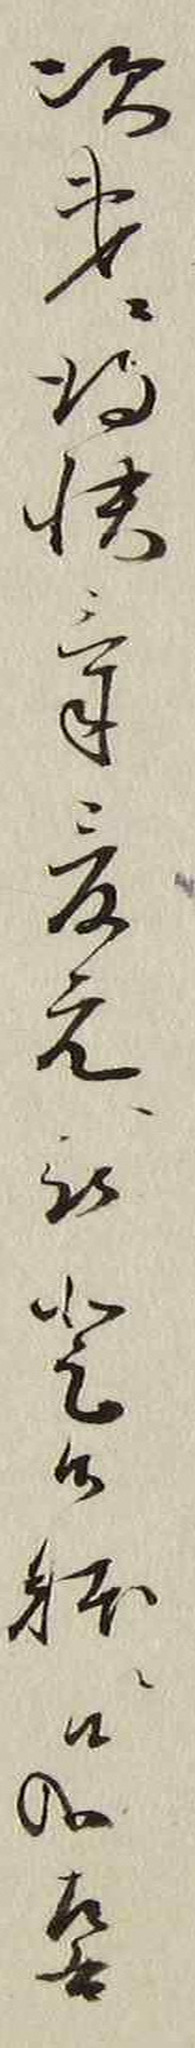次第に得快気爰元へ被登候体に候哉乍去
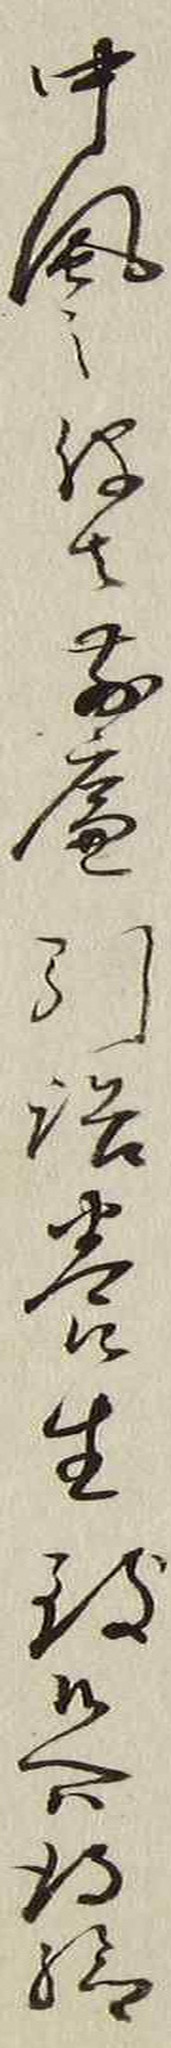中風之儀は前廉引張養生致候へは得晴
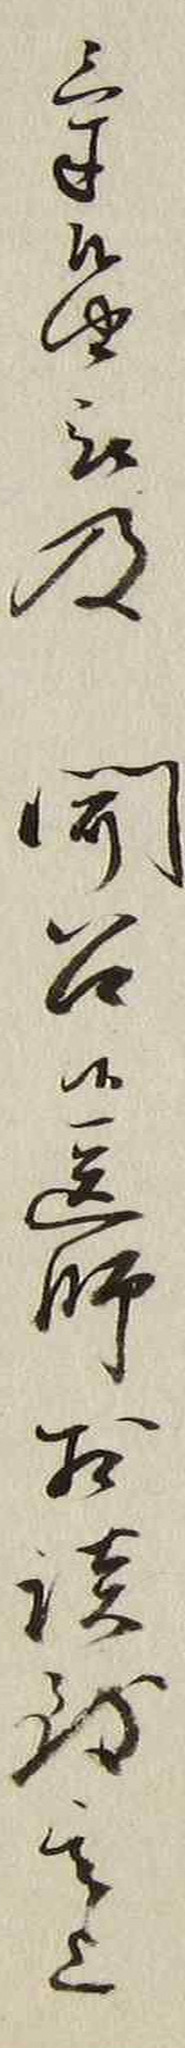気候由被及聞召候医師へ相談致其上
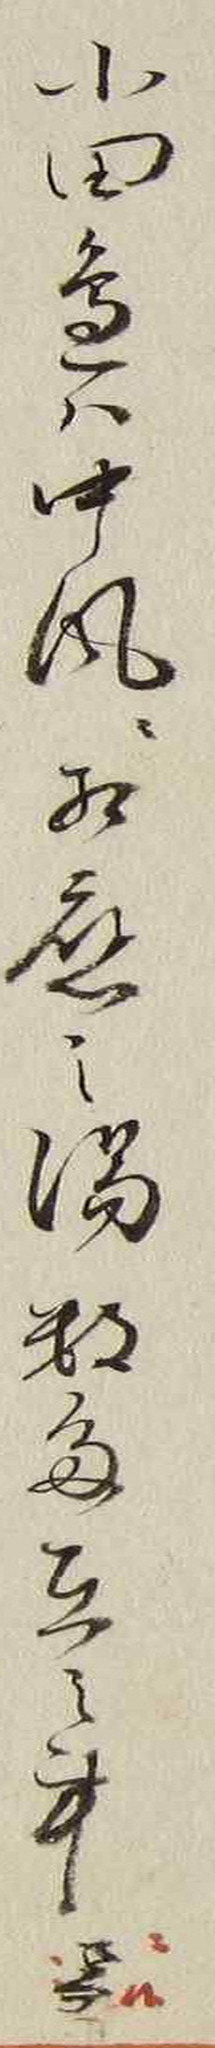小田辺は中風に相応之湯数多在之事に候
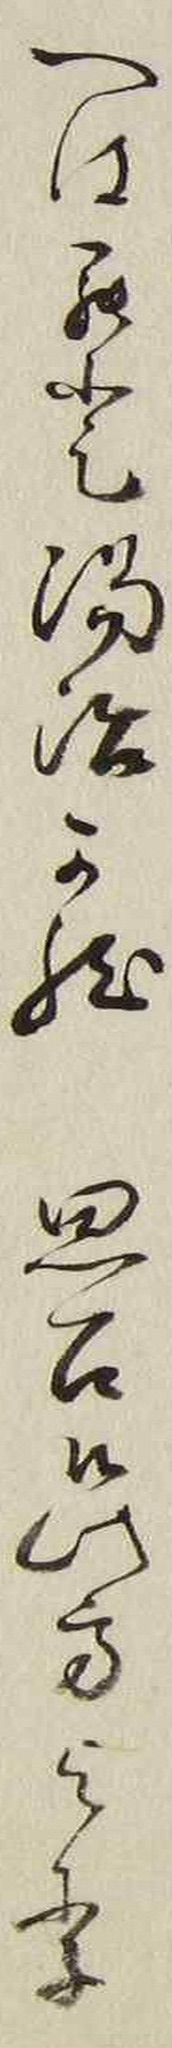へは罷登湯治可然思召候此方より

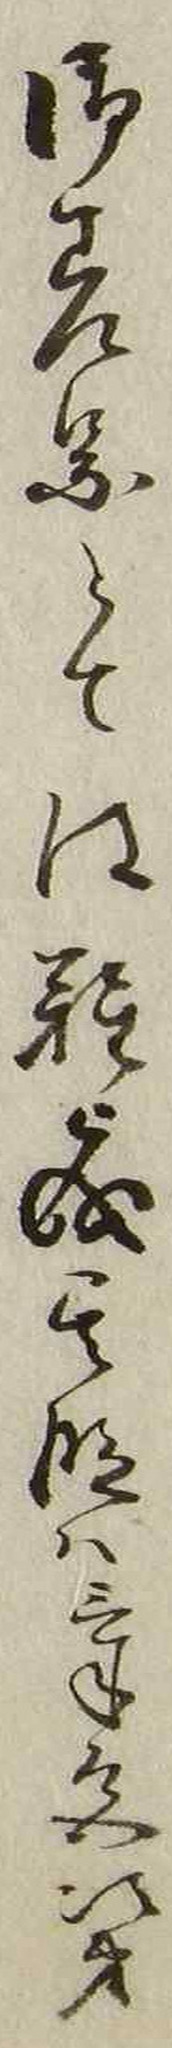御差図にては難被成其段は気色次第
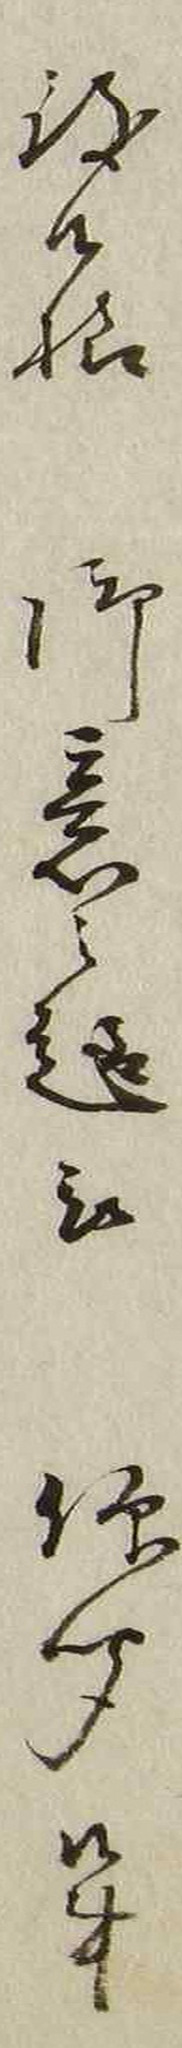致候様御意之趣被仰聞候事
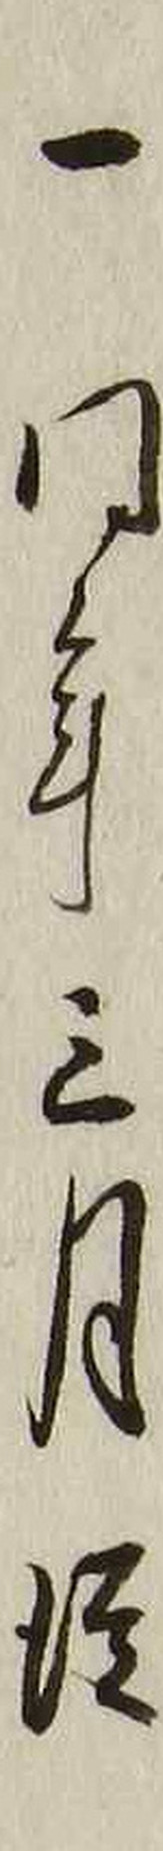一同年三月従
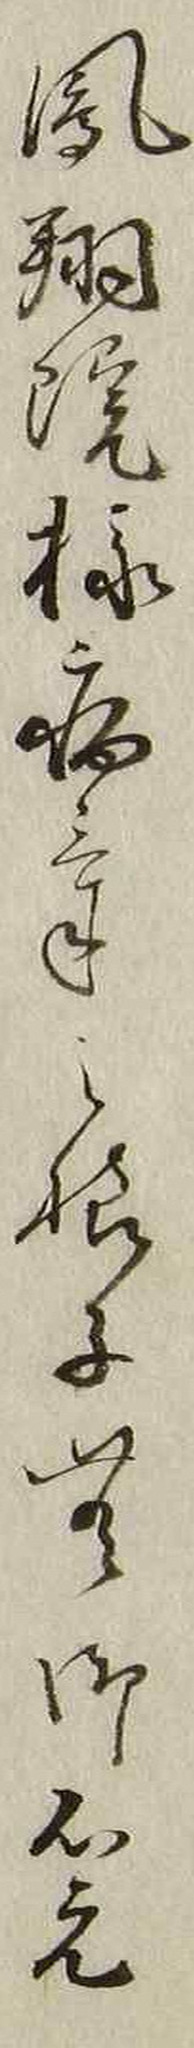鳳翔院様病気之様子無御心元
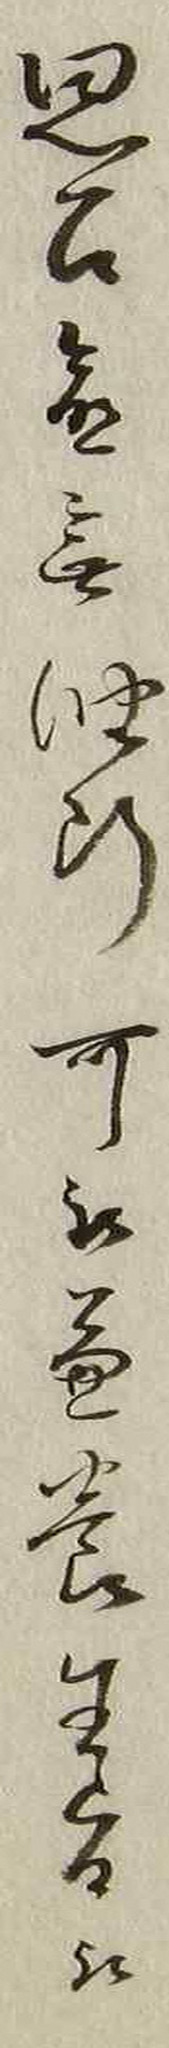思召置無由断可被兼養生旨被
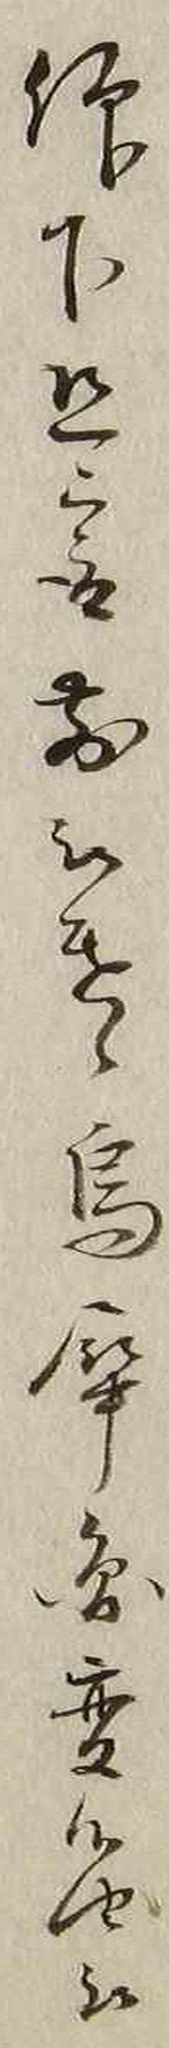仰下旦被取前被遣候烏犀円変候由被
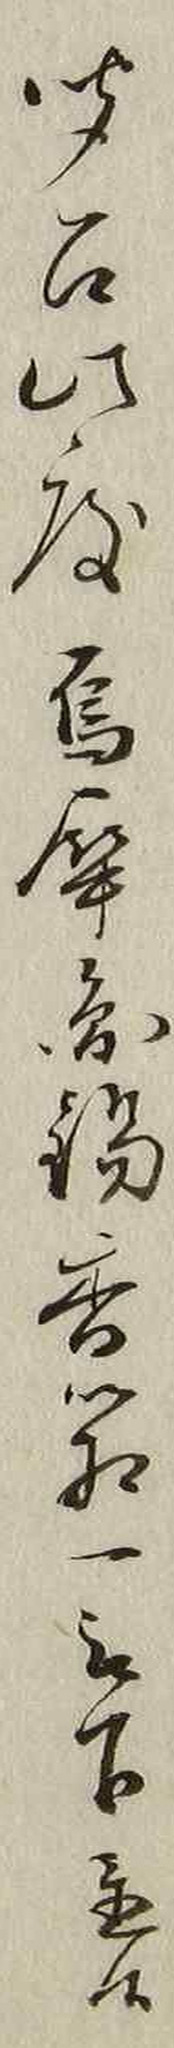聞召此度烏犀円鍋香箱一被下置候
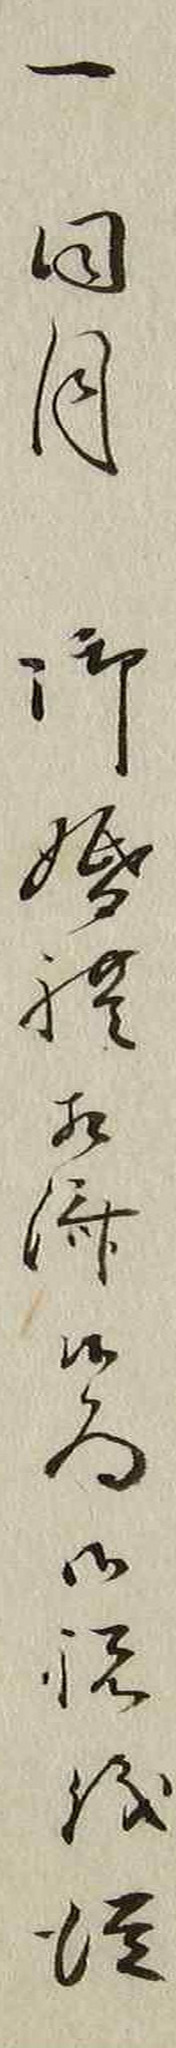一同月御婚礼相済候為御祝儀従
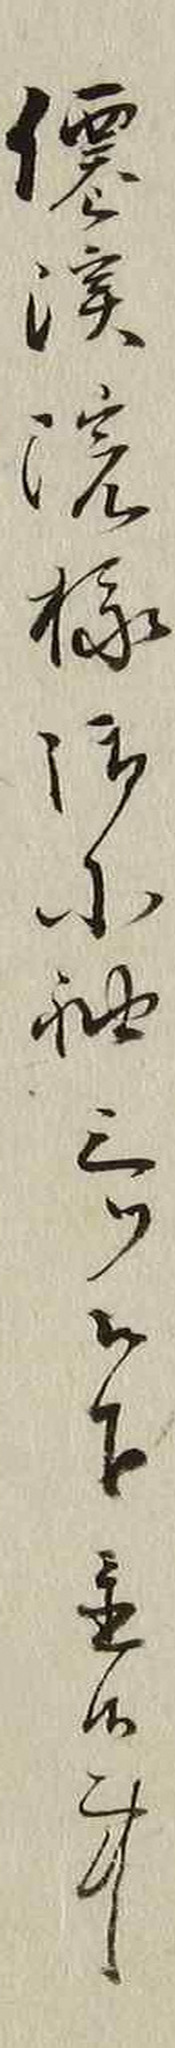僊渓院様御小袖三つ被下置候事
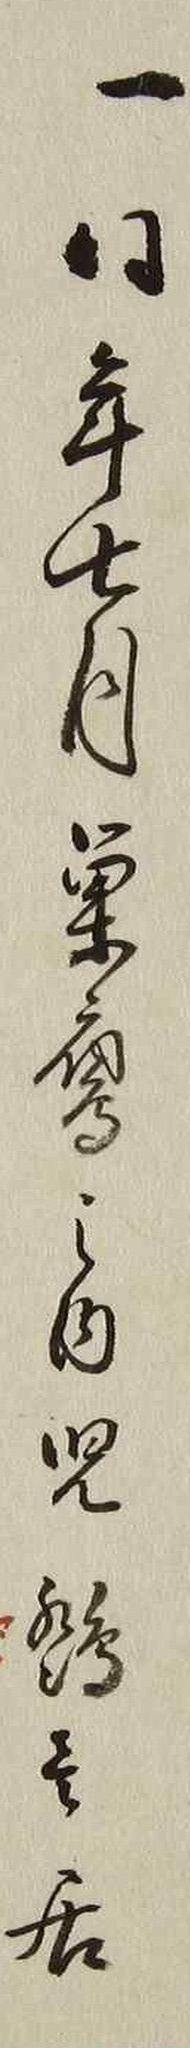一同年七月巣鷹之内児鷂壱居
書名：諸士系譜　巻之159　な之部1
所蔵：会津若松市立会津図書館
